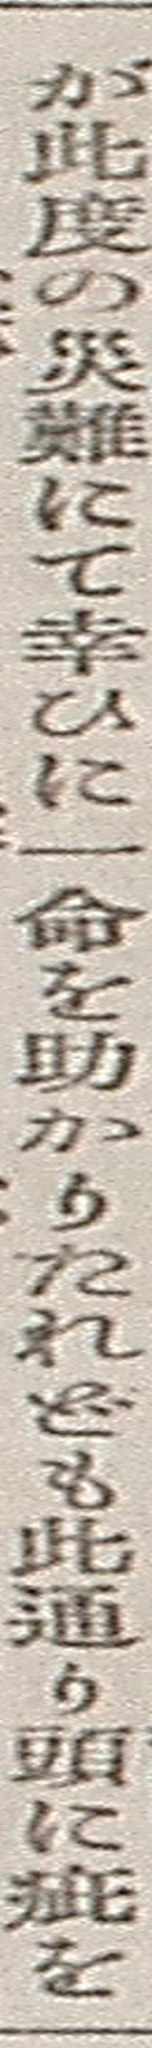が此度の災難にて幸ひに一命を助かりたれども此通り頭に疵を
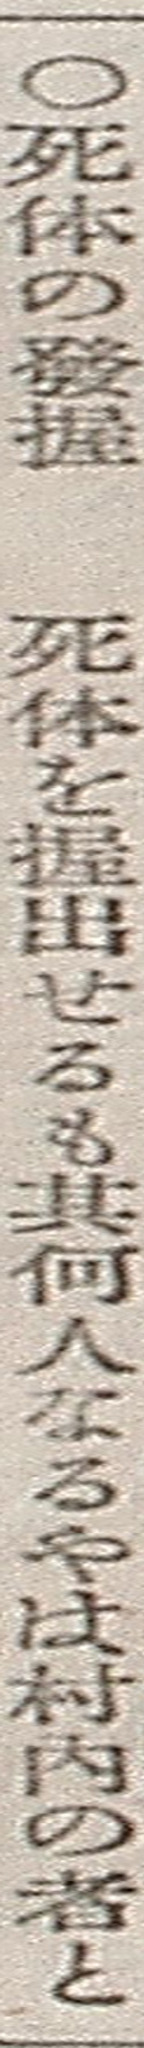○死体の発握死体を握出せるも其何人なるやは村内の者と
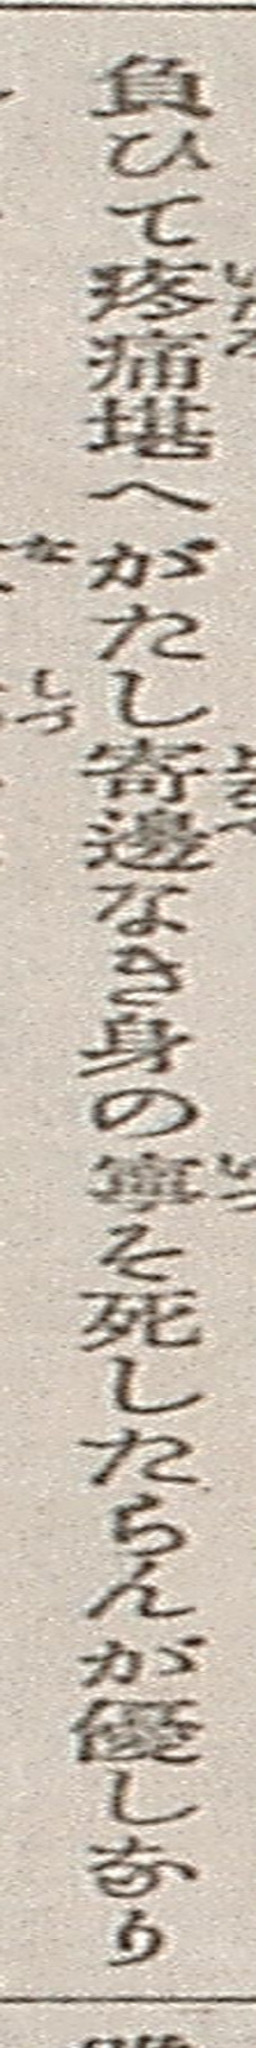負ひて疼痛堪へがたし寄辺なき身の寧そ死したらんが優しなり
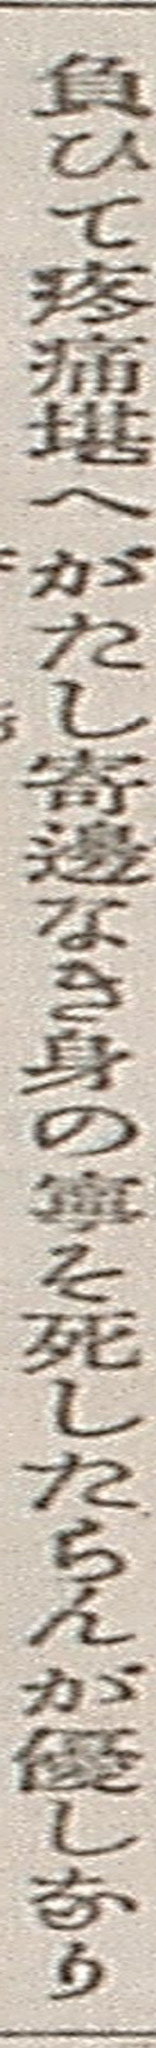負ひて疼痛堪へがたし寄辺なき身の寧そ死したらんが優しなり
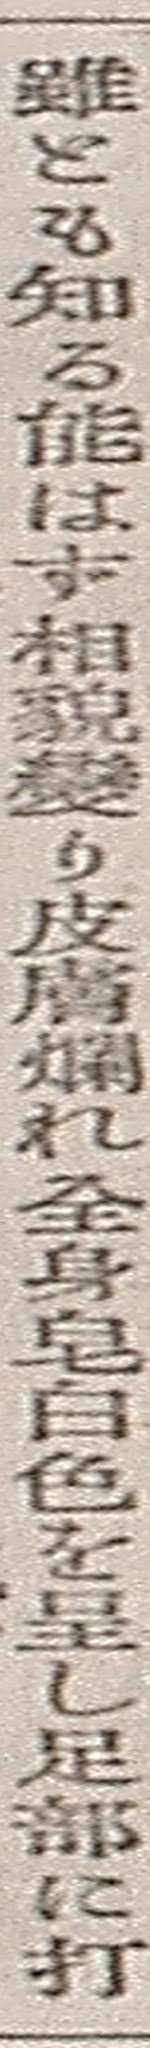雖とも知る能はず相貌変り皮膚爛れ全身皂白色を呈し足部に打
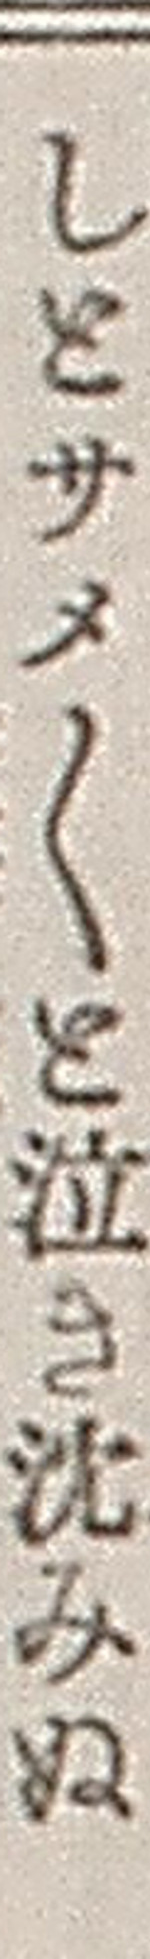しとサメ〳〵と泣き沈みぬ
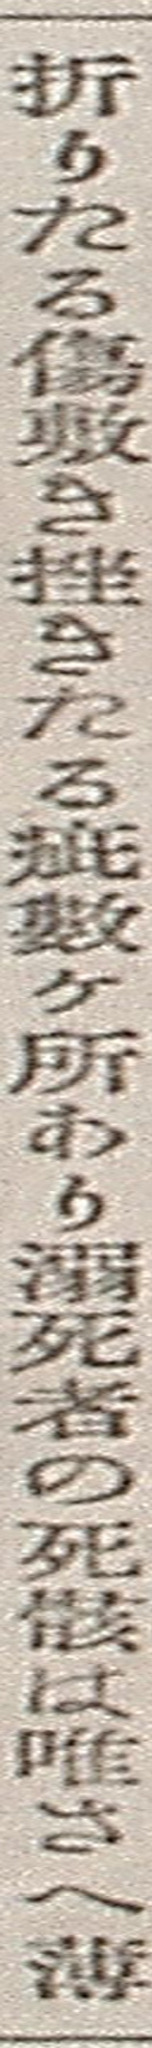折りたる傷敷き挫きたる疵数ヶ所あり溺死者の死骸は唯さへ薄
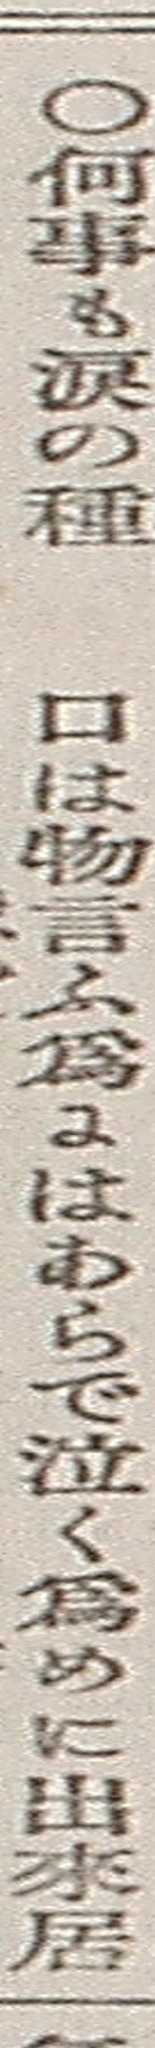○何事も涙の種口は物言ふ為にはあらで泣く為めに出来居
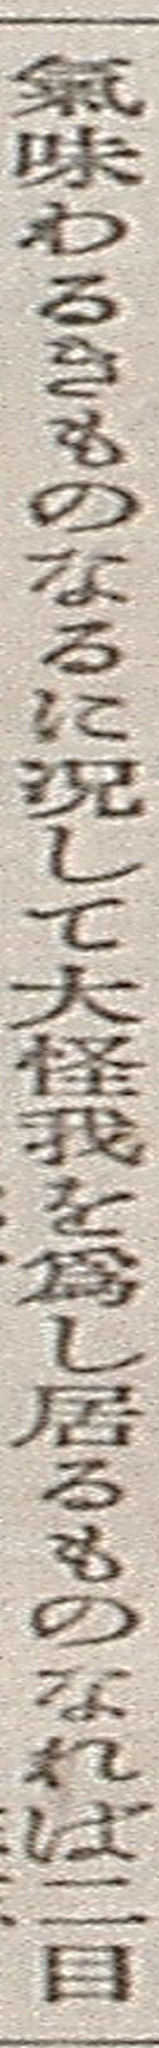気味わるきものなるに况して大怪我を為し居るものなれば二目
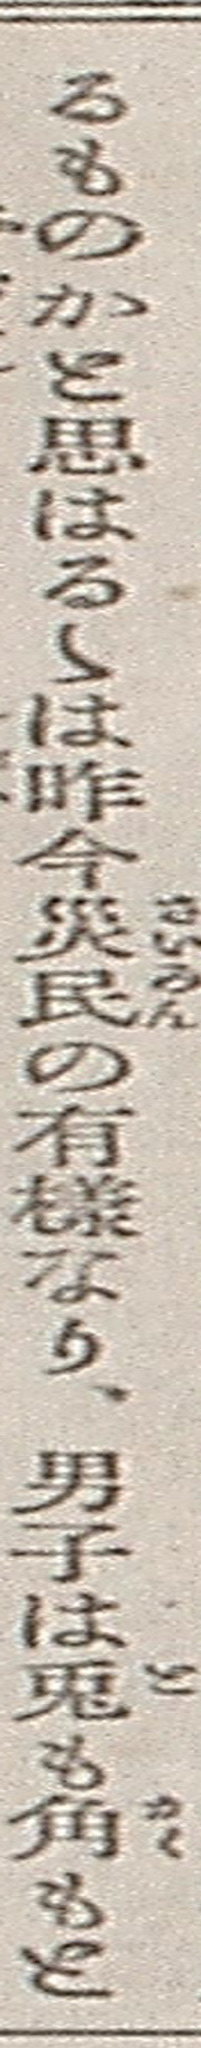るものかと思はるゝは昨今災民の有様なり、男子は兎も角もと
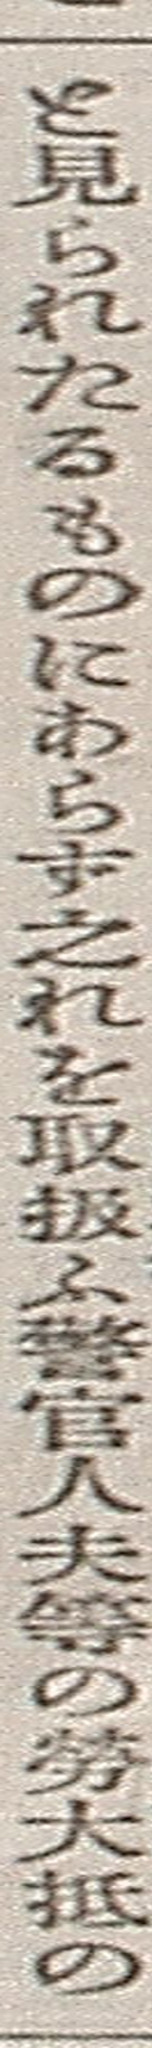と見られたるものにあらず之れを取扱ふ警官人夫等の労大抵の
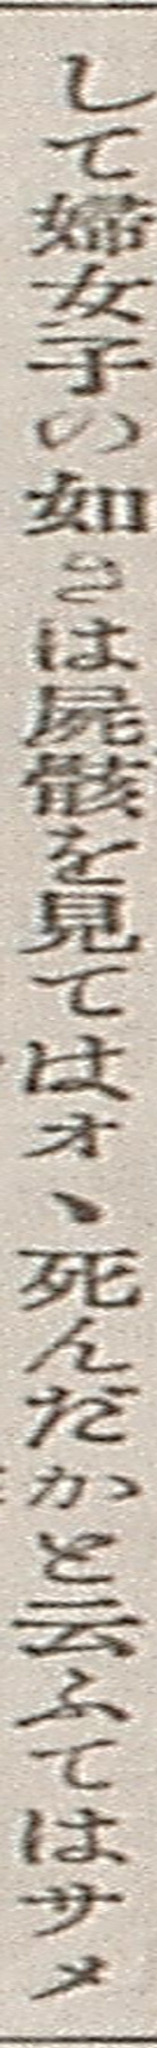して婦女子の如きは屍骸を見てはオヽ死んだかと云ふてはサメ
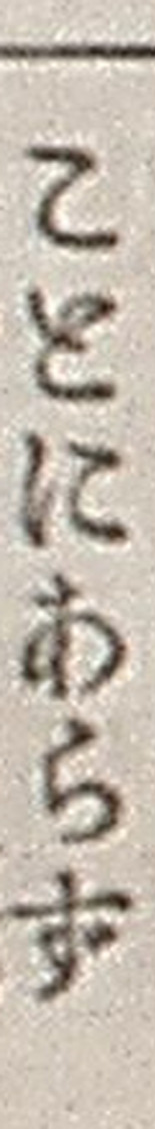ことにあらず
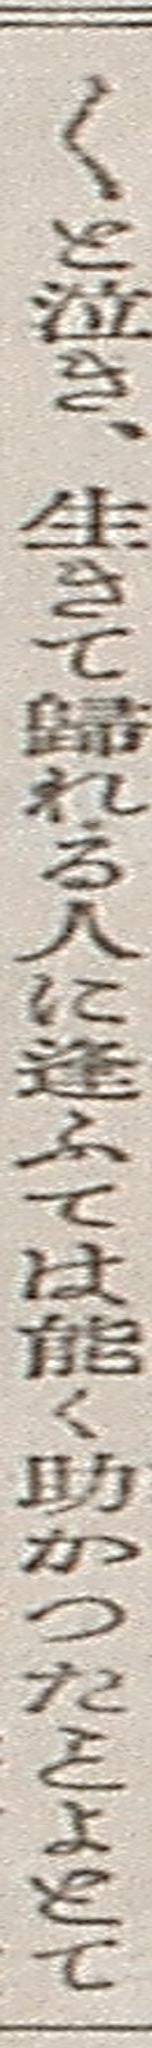〳〵と泣き、生きて帰れる人に逢ふては能く助かつたことよとて
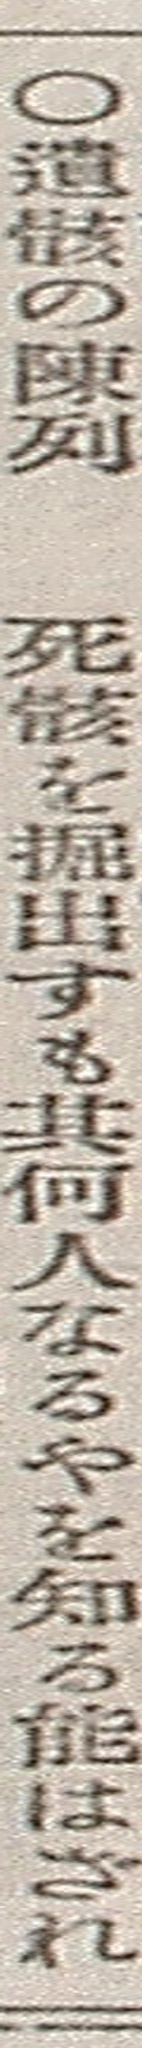○遺骸の陳列死骸を堀出すも其何人なるやを知る能はざれ
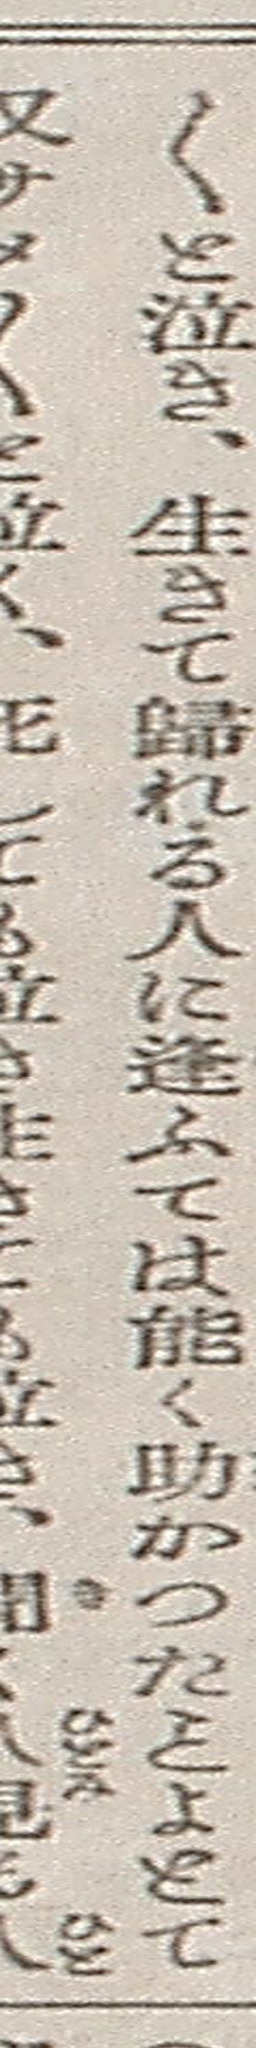又サメ〳〵と泣く、死しても泣き生きても泣き、聞く人見る人
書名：風俗畫報臨時増刊第百十九號　大海嘯被害録（中）
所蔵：東京大学地震研究所図書室 Earthquake Research Institute Library, The University of Tokyo, JAPAN
